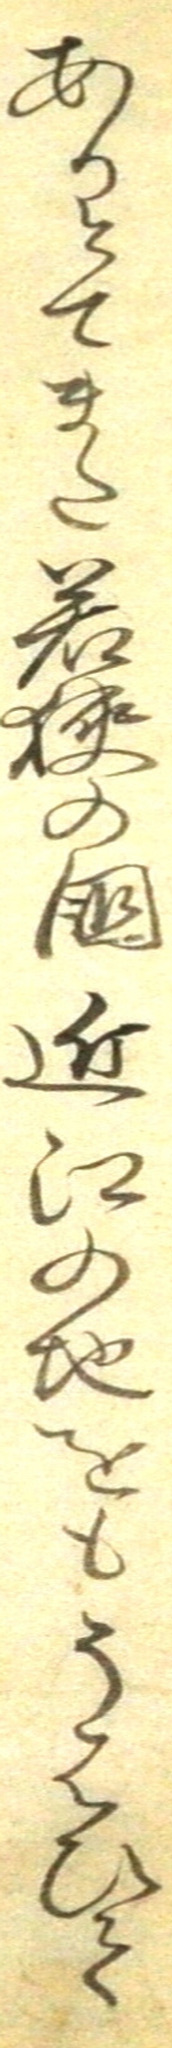ありとてまた若狭の国近江の地をもうはひて
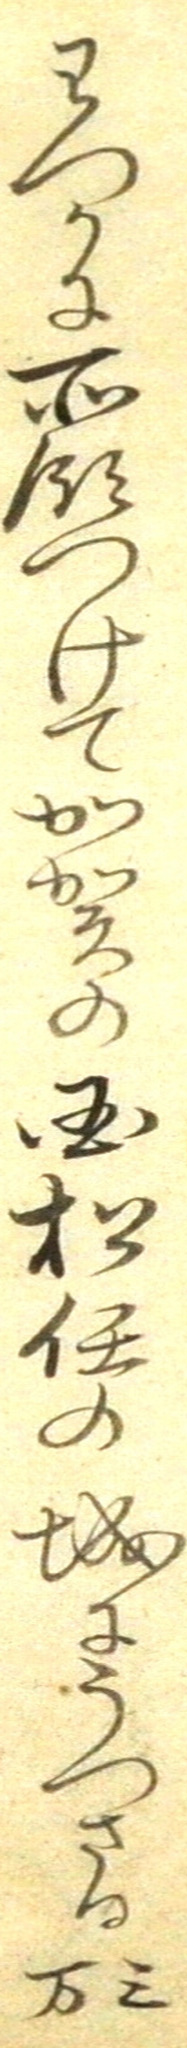わつかに所領つけて加賀の国松任の城にうつさる三万
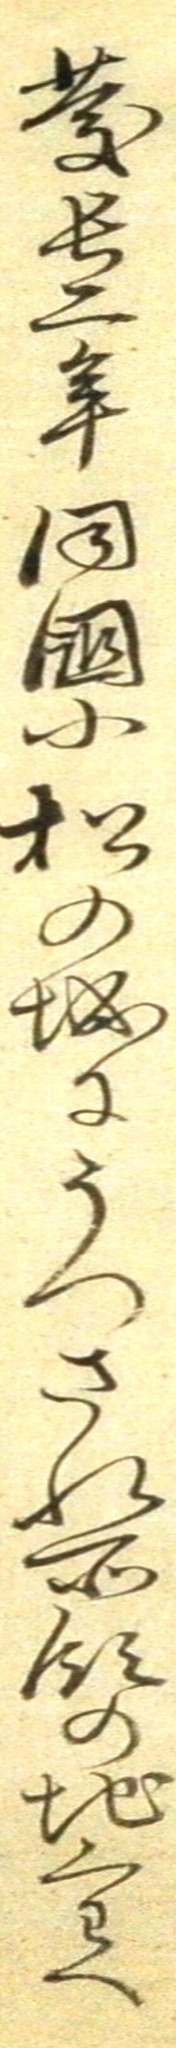慶長二年同国小松の城にうつされ所領の地くわへ
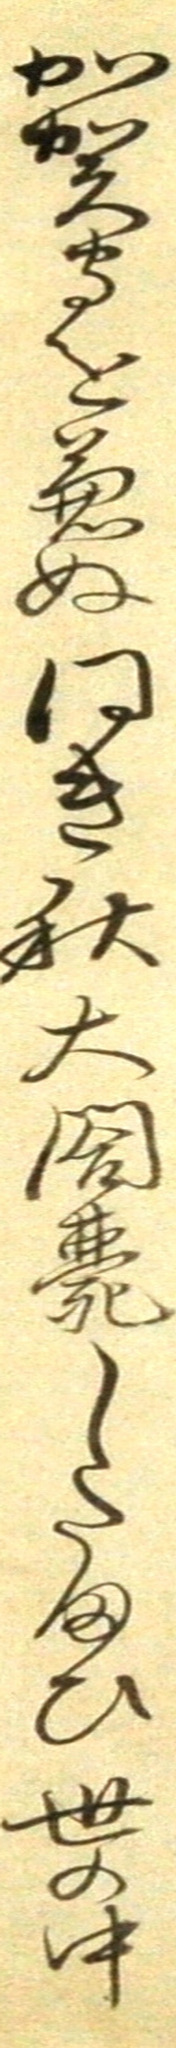加賀守を兼ぬ同き秋太閤薨したまひ世の中
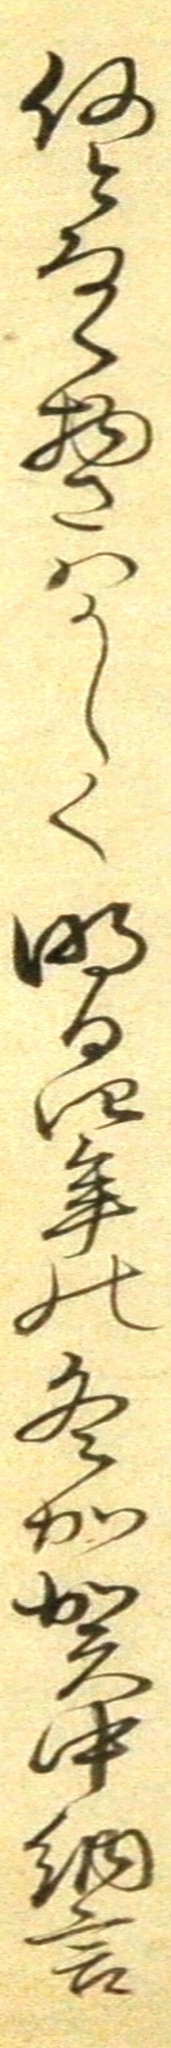何となく者さはかしく明る四年の冬加賀中納言
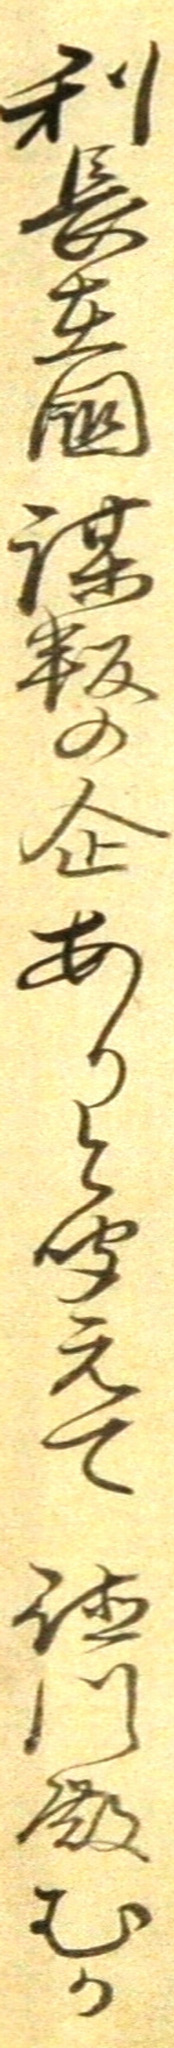利長在国謀叛の企ありと聞えて徳川殿むか

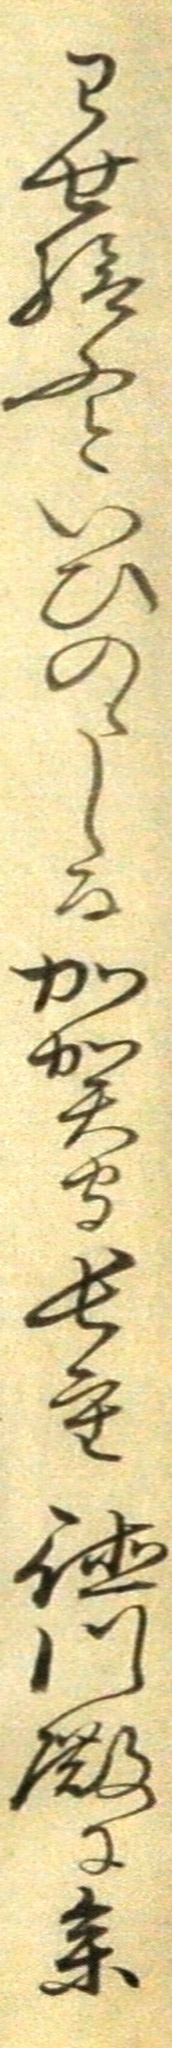わせ給ふといひのゝしる加賀守長重徳川殿に参
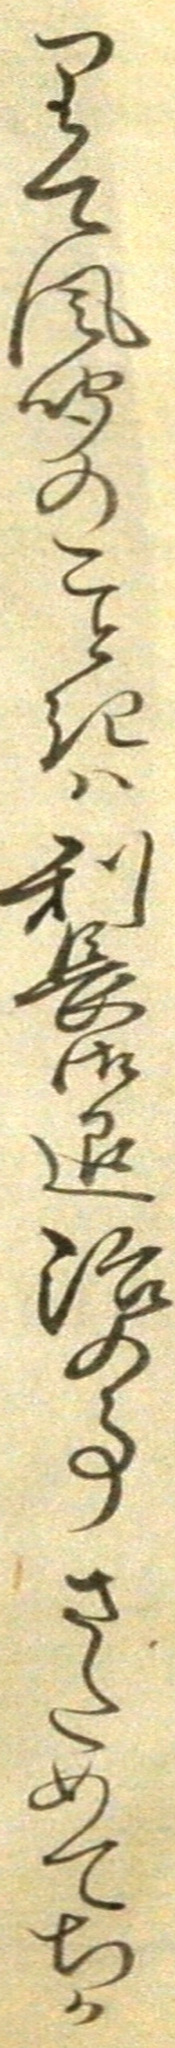りて風聞のこときは利長御退治の事さためてちか
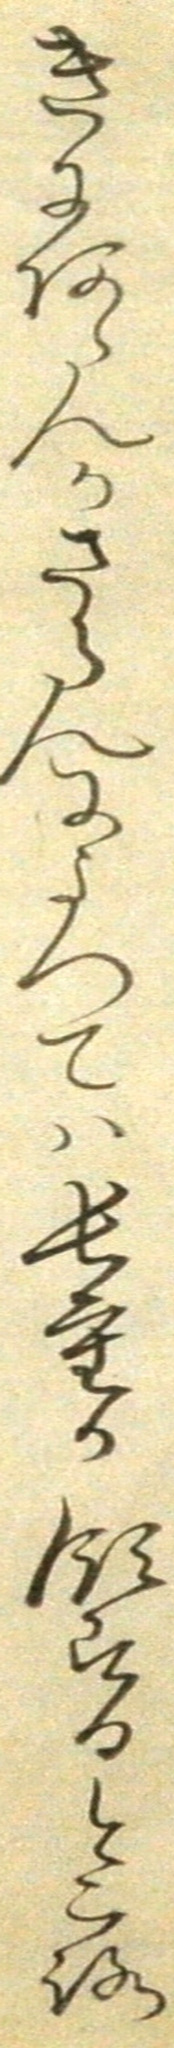きにあらんかさらんによつては長重か領するところ
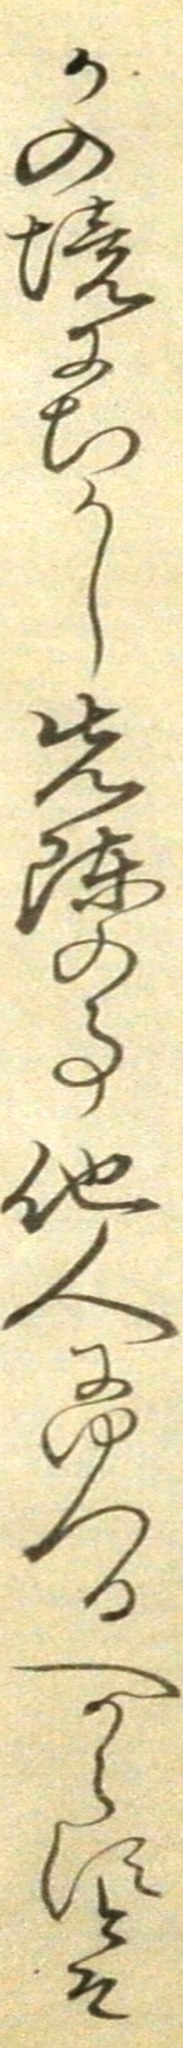かの境にちかし先陣の事他人にゆつるへからすとそ
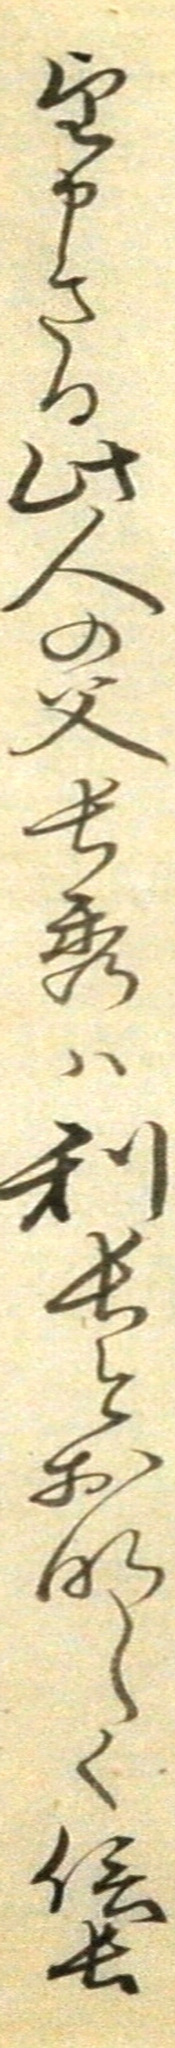望申さる此人の父長秀は利長とおなしく信長
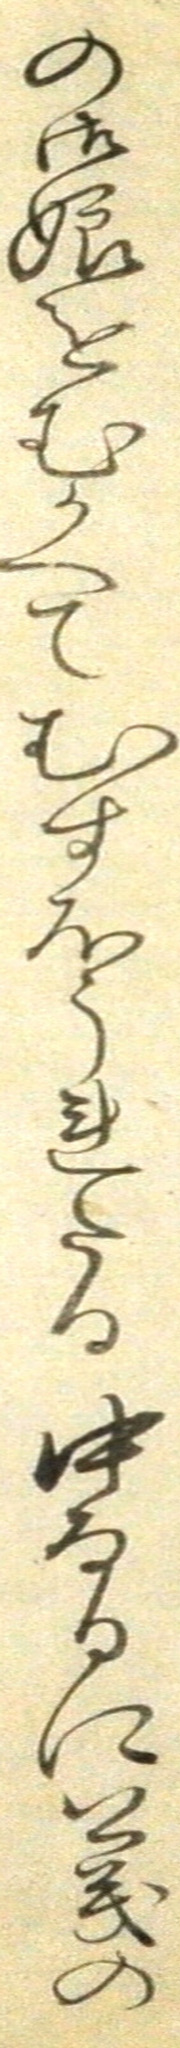の御娘をむかへてむすほうれたる中なるに公義の
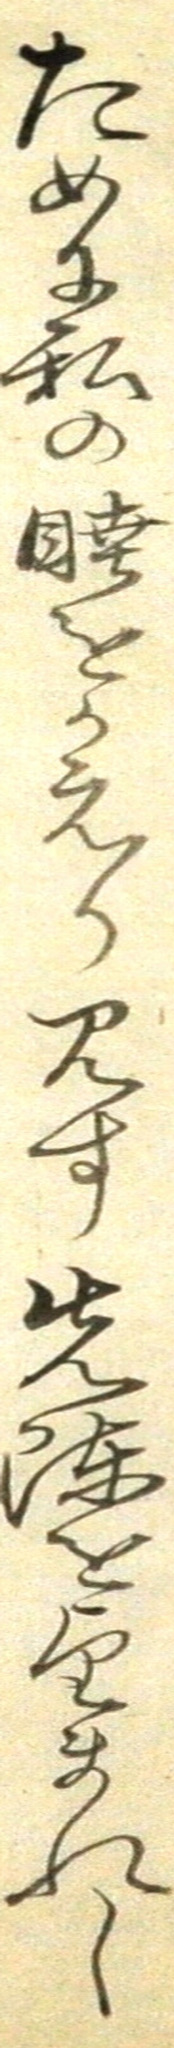ために私の睦をかえり見す先陣を望まれし
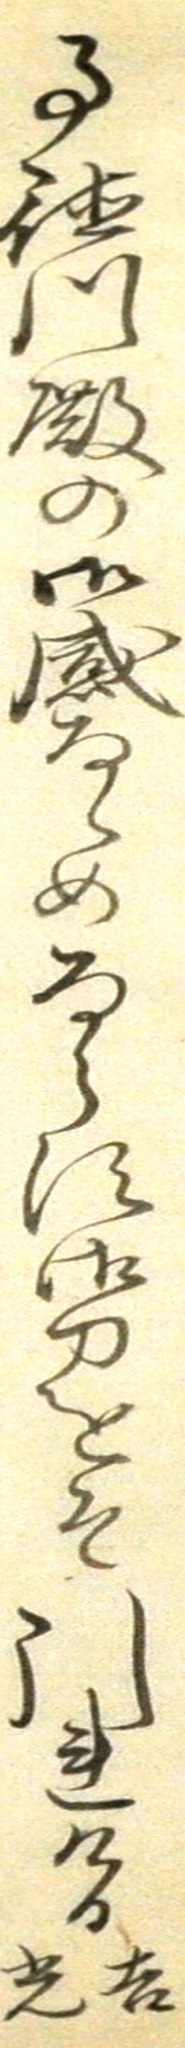事徳川殿の御感なゝめならす御刀をそ引れける吉光
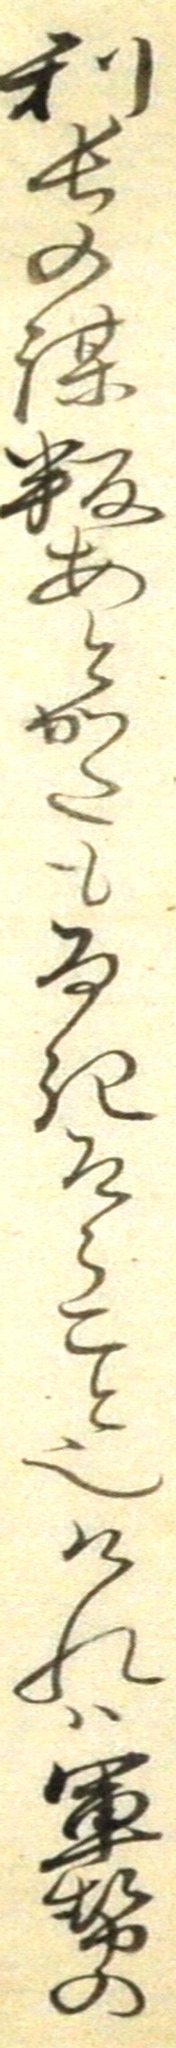利長の謀叛あとかたもなきそらこと也けれは軍勢の
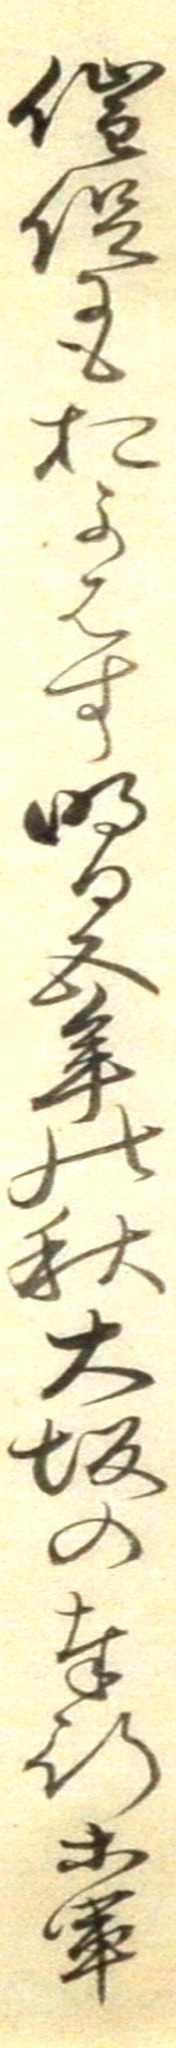催促にもおよはす明る五年の秋大坂の奉行等軍
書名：藩翰譜（八・下）
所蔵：伊那市立高遠町図書館・合同会社AMANE
